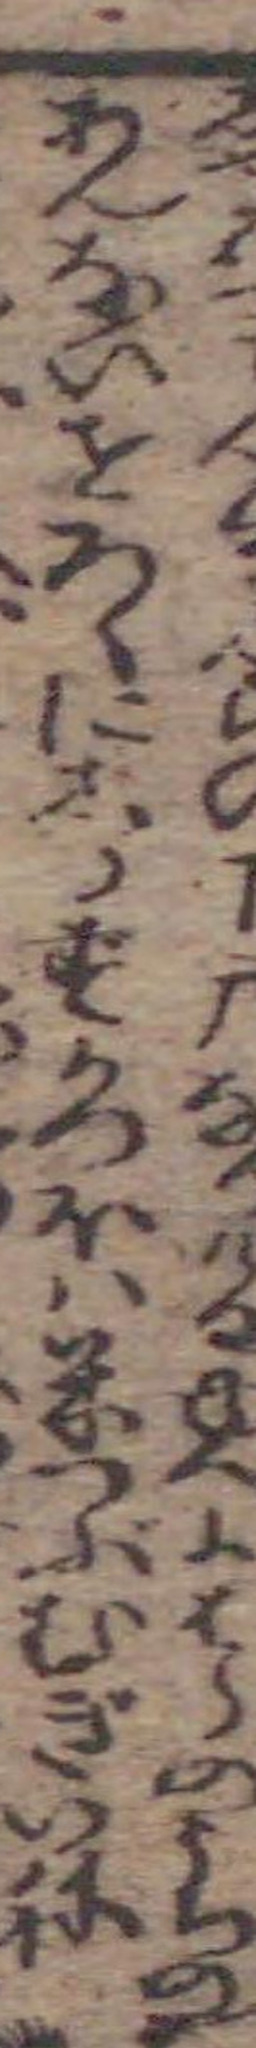あんないをろくにしらずかつほは米つぶむぎいね
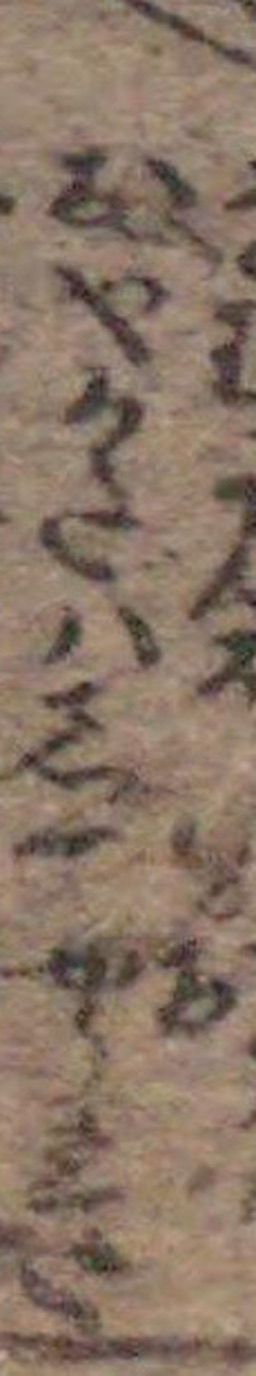おやかたはしてやられた
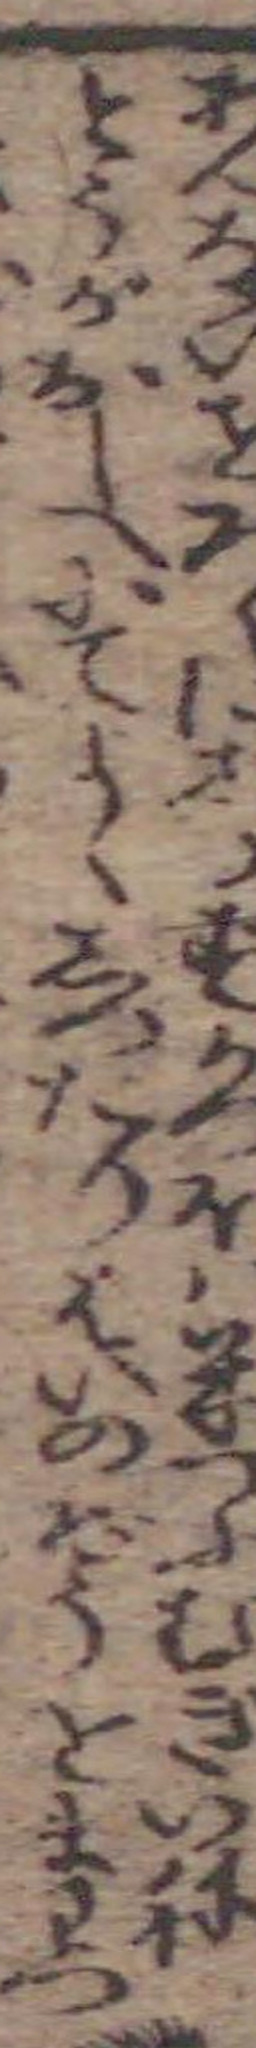とうがおしへにてよくしつたりはいのぞうをまわつ
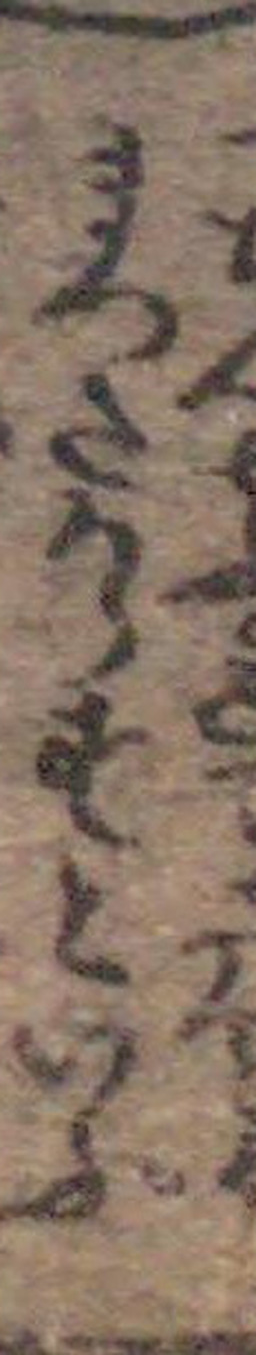まつたからずといふ
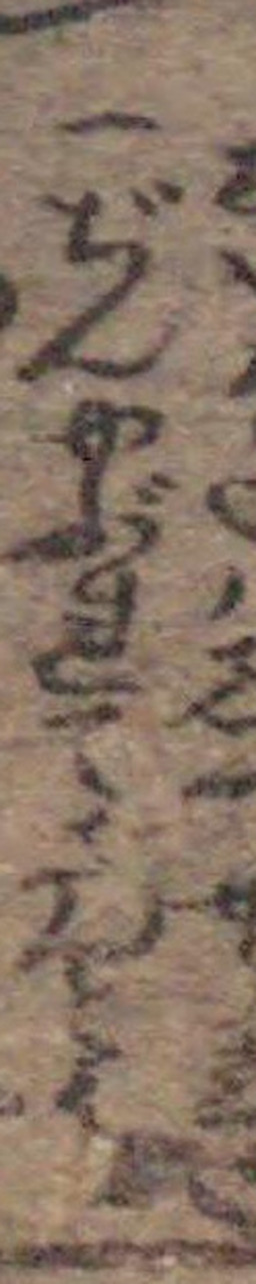一ぢんやぶれてざんとう
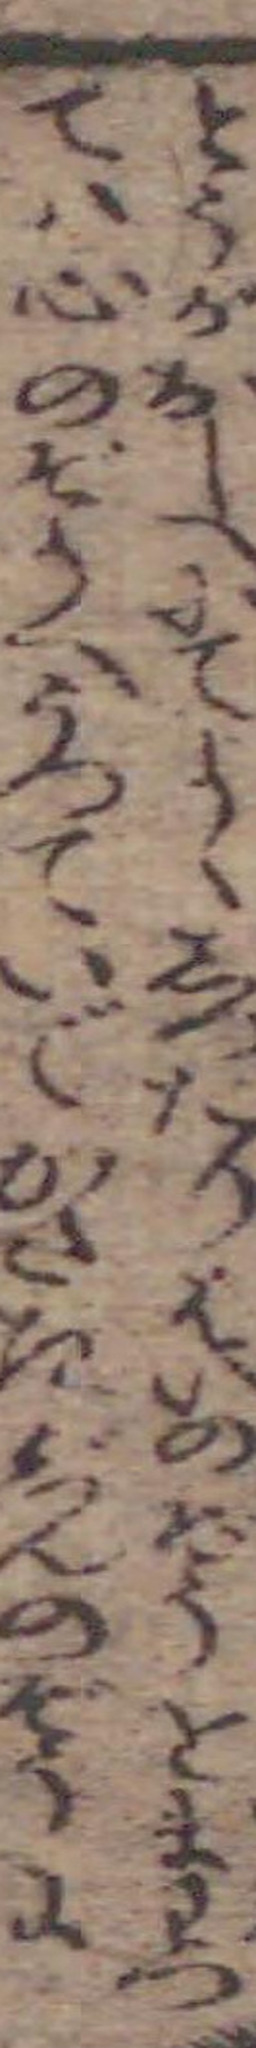ては心のぞうへうつていでかたきぢんのぞうに
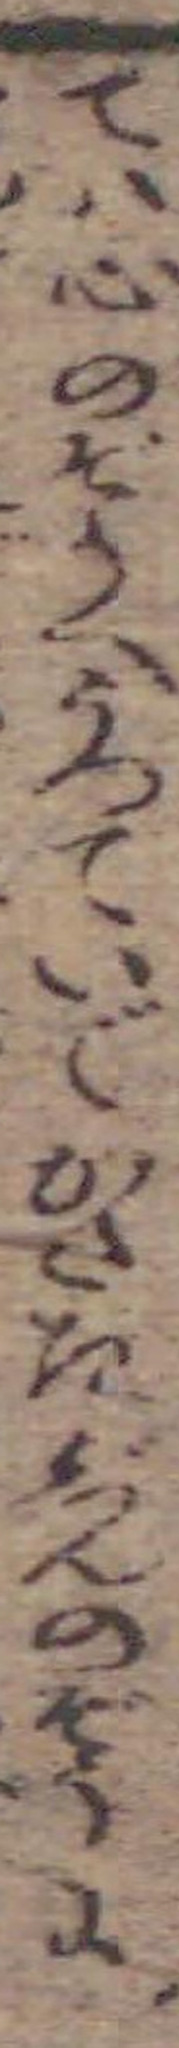ては心のぞうへうつていでかたきぢんのぞうに
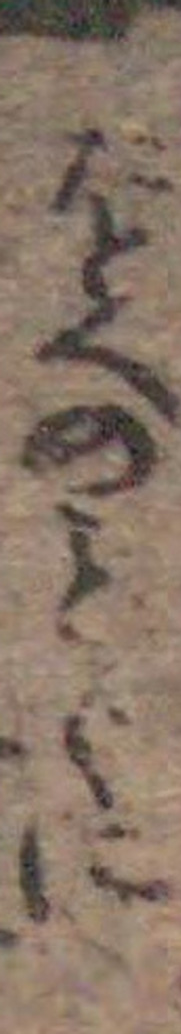たとへのことくに
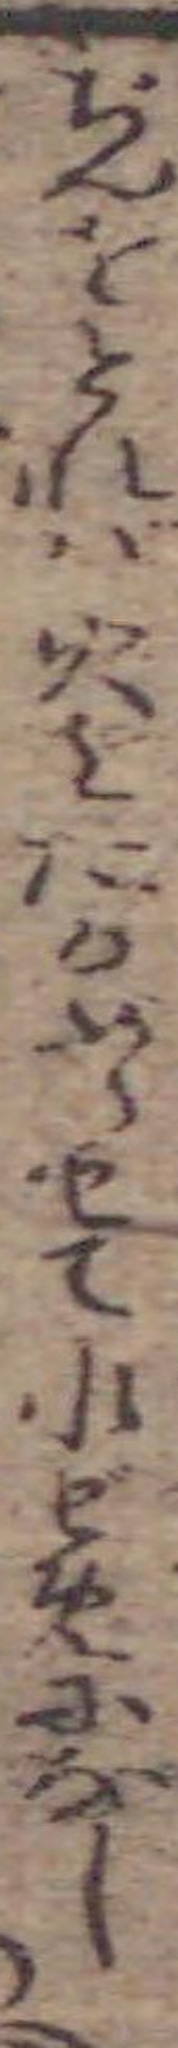ぢんをとれば火をたかぶらせて水ぜめになし
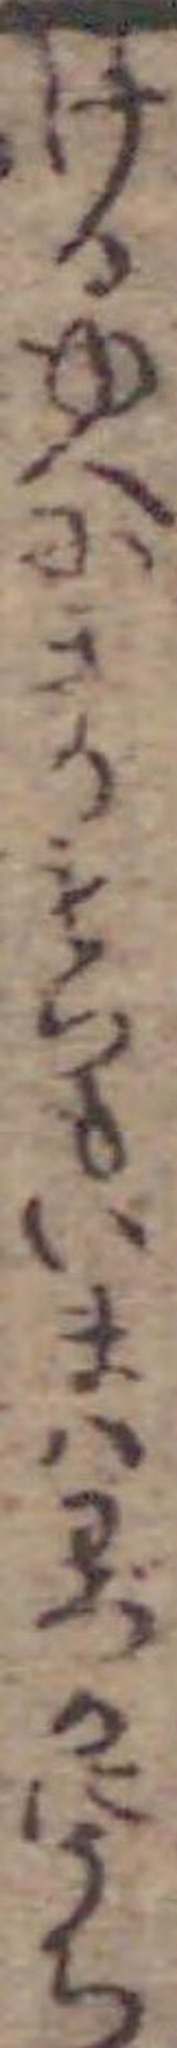けるゆへにきりもちもいまはわづかにうち
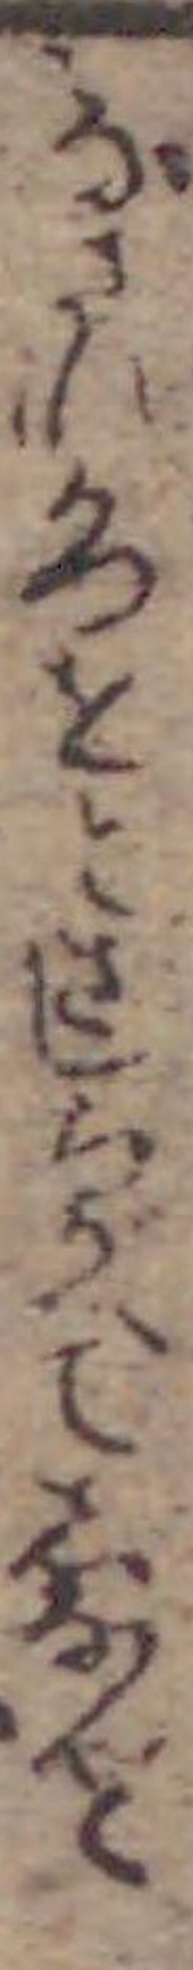なされかつをとさしちがへてしなんと
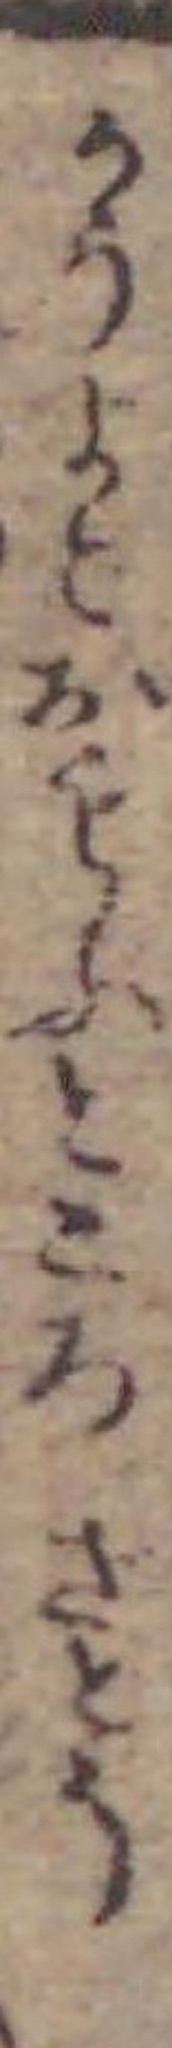かうよとおもふところざとう
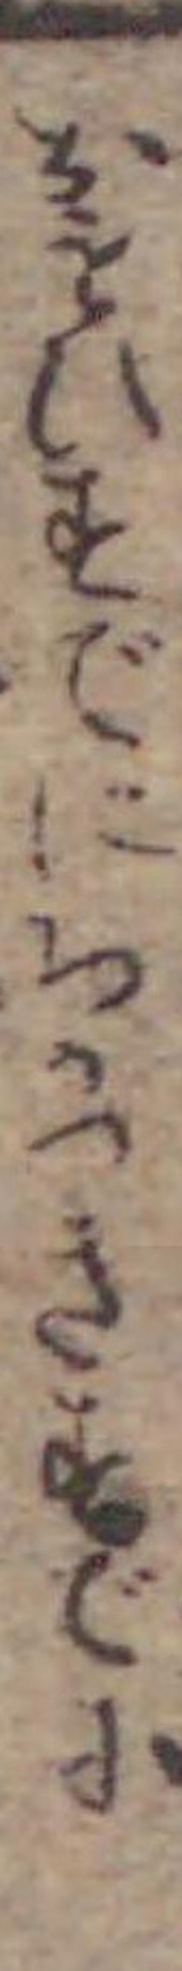おもひすでにちかつきすでに
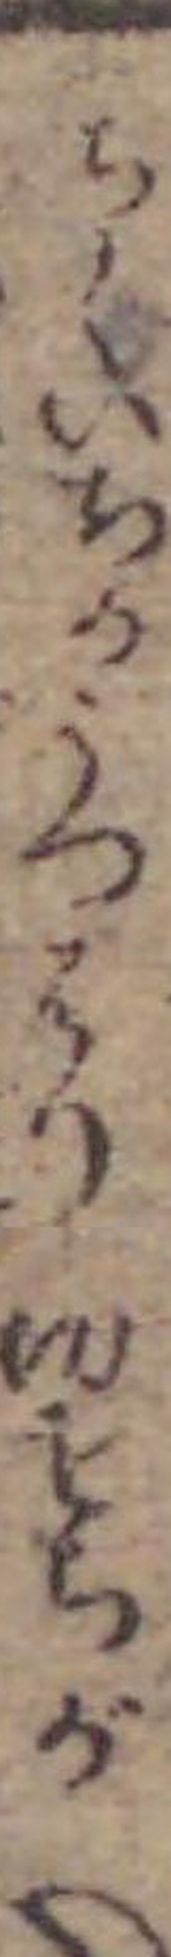ちくいちかうつはり切もちが
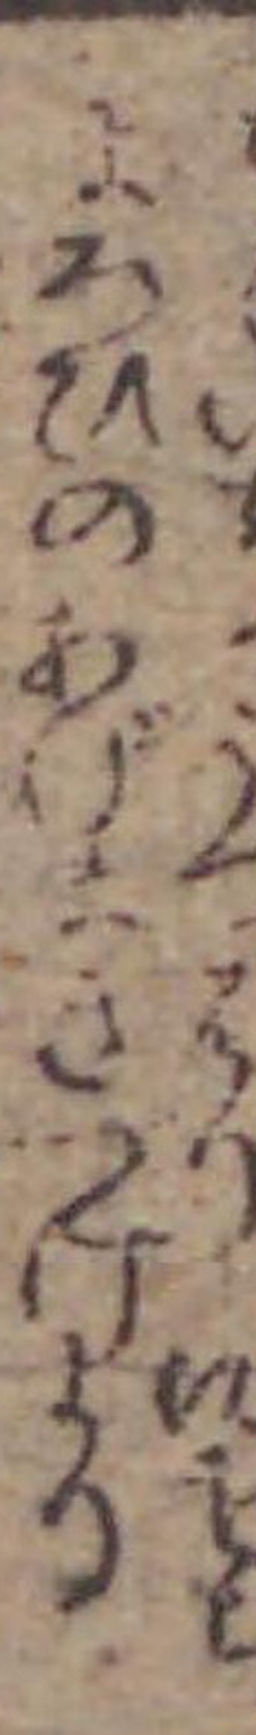よろひのあげまきづけより
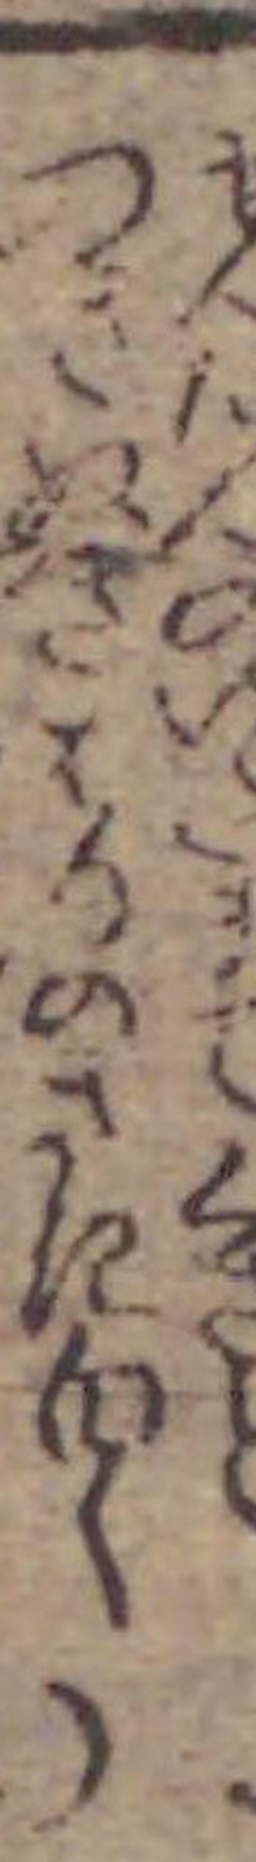つきぬきはりのさき白く
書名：腹京師食物合戦 : 2巻
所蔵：国立国会図書館 National Diet Library, JAPAN
